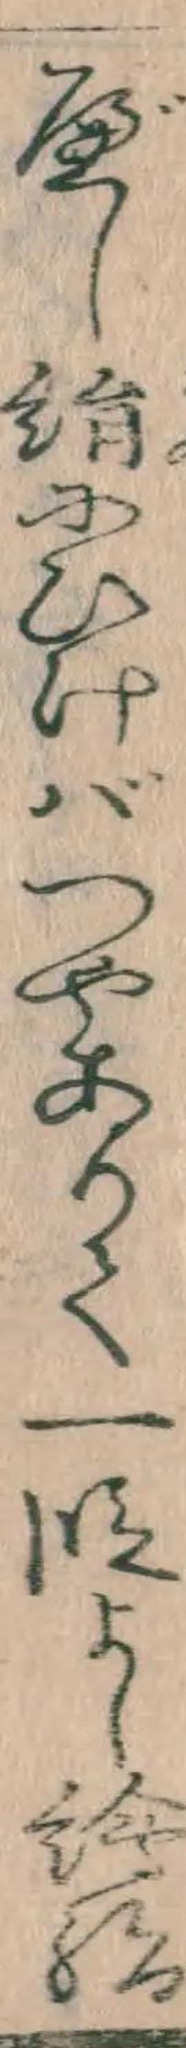べし絹にひけばつやありて一段よし絵絹
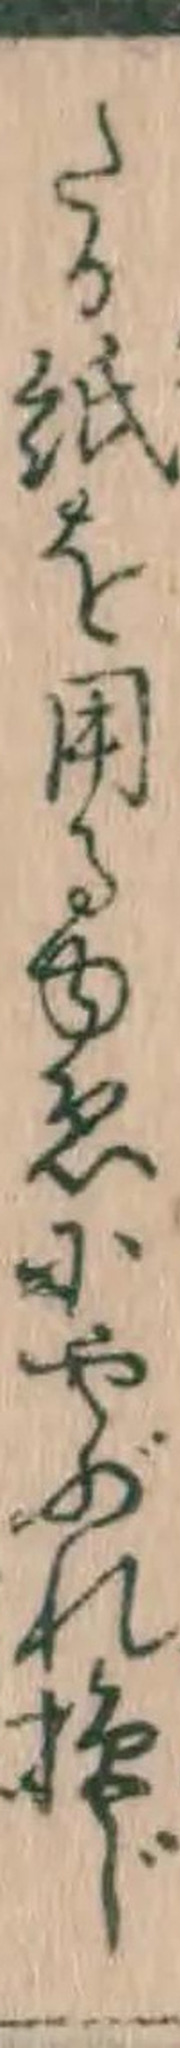たる紙を用るゆゑにやぶれ損じ
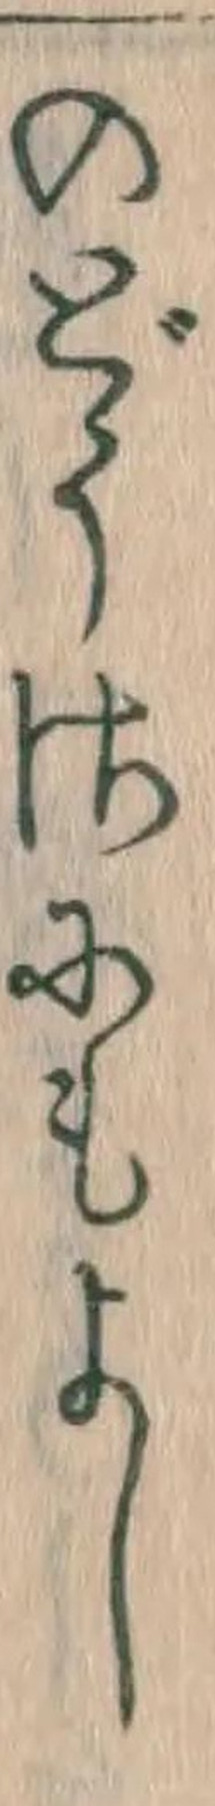のどうさにもよし
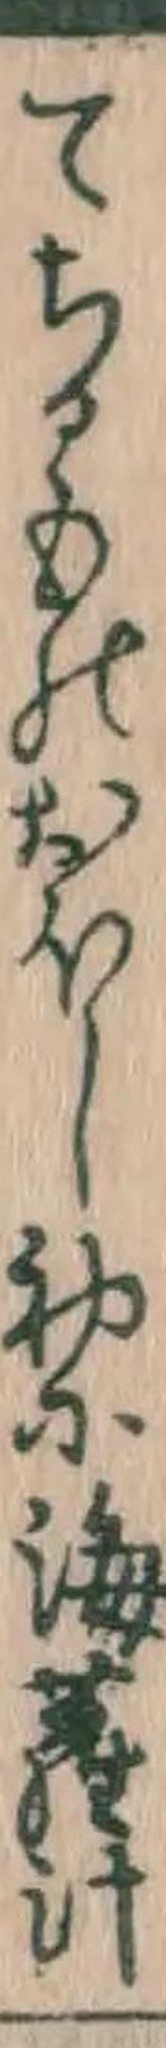てちるものおほし初に海蘿汁
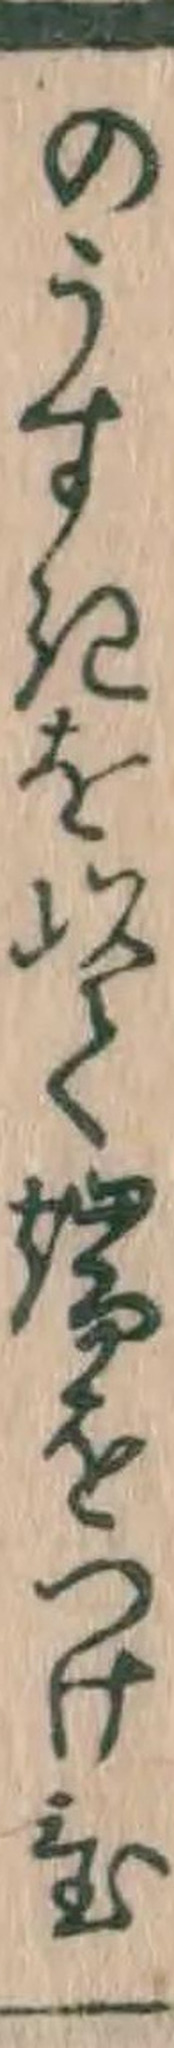のうすきを以て端をつけ置
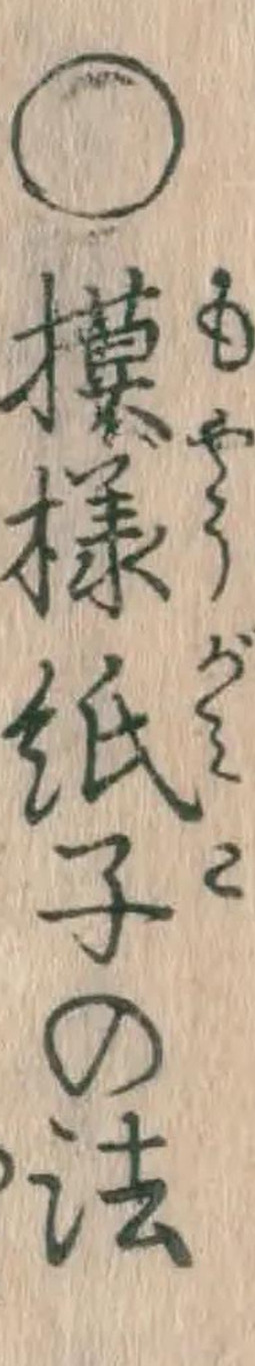○摸様紙子の法
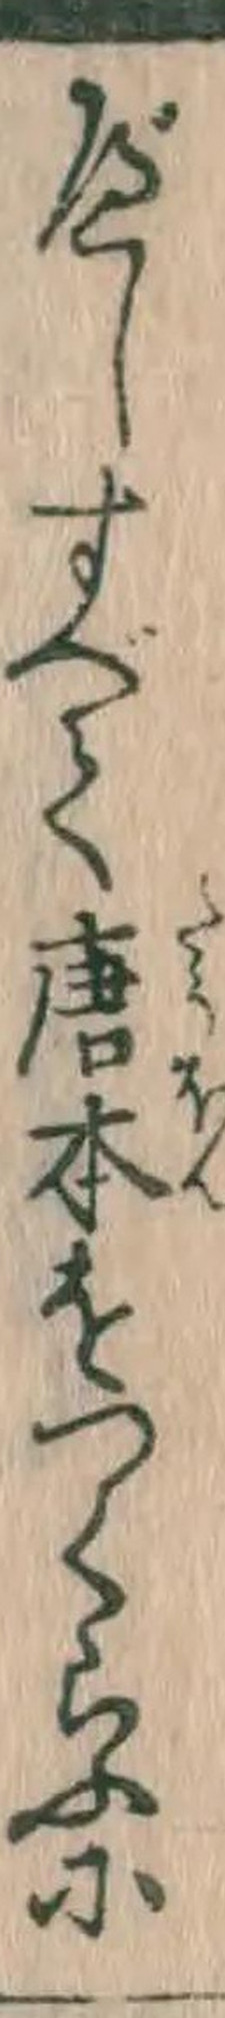べしすべて唐本をつくらふに
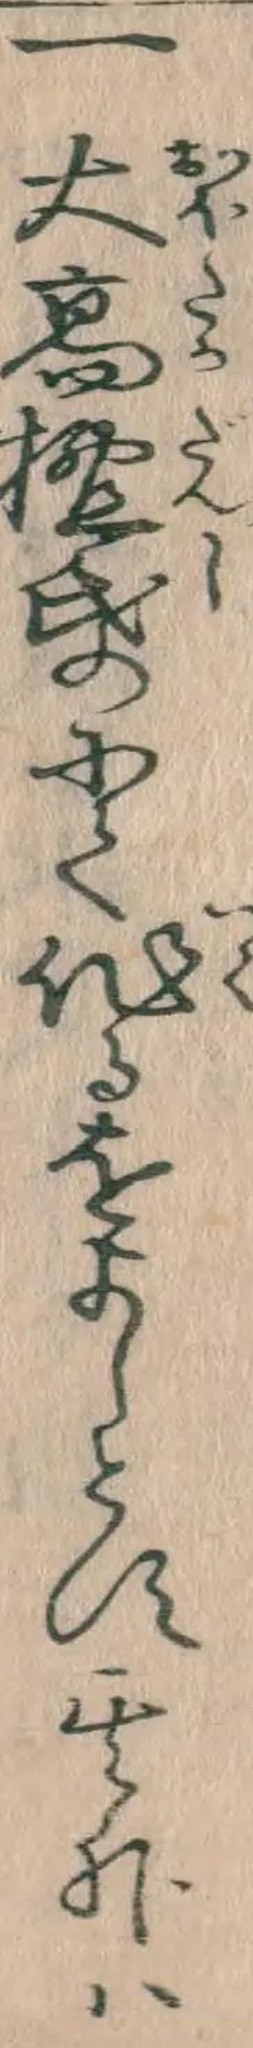一大高檀紙にて作るをよしとす其外は
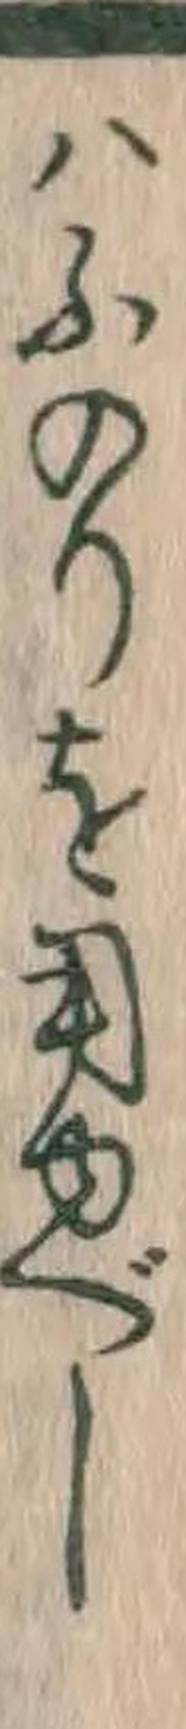はふのりを用ゆべし
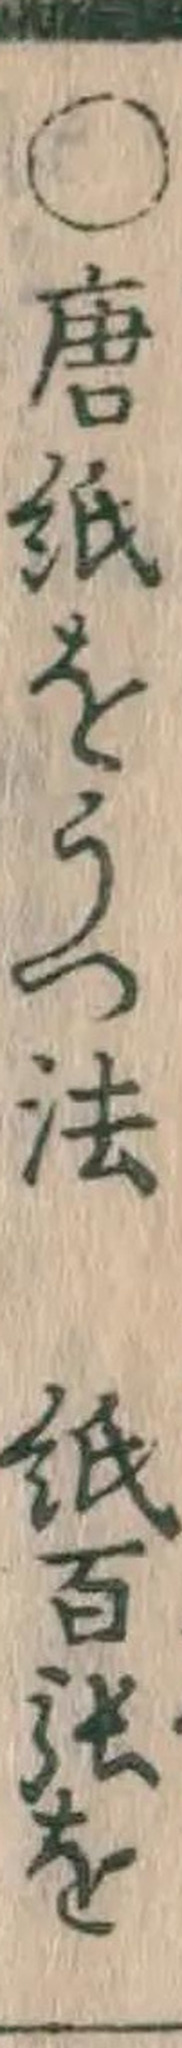○唐紙をうつ法紙百張を
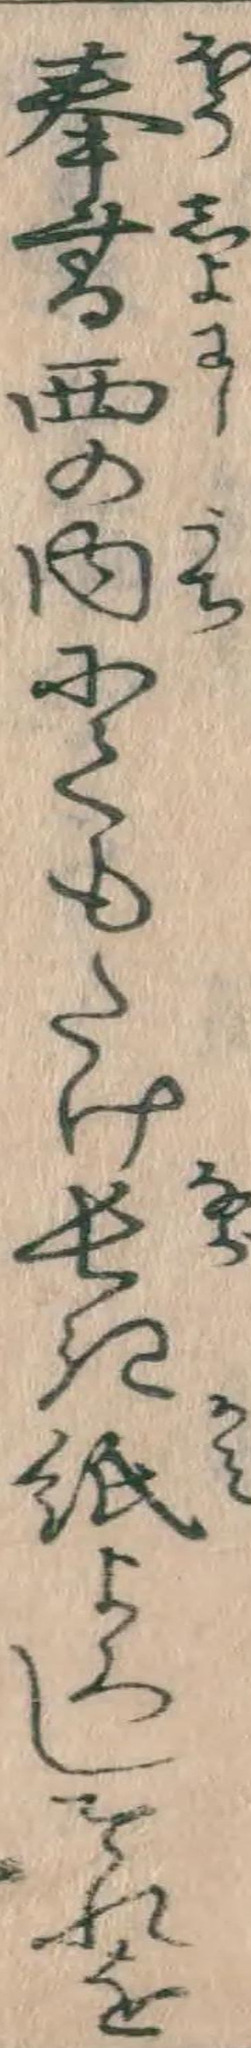奉書西の内にてもたけ長き紙よろしそれを
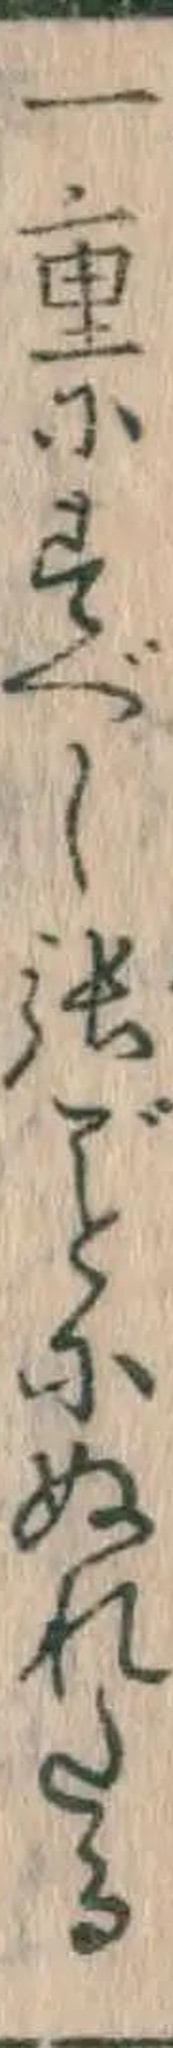一重にすべし張ごとにぬれたる
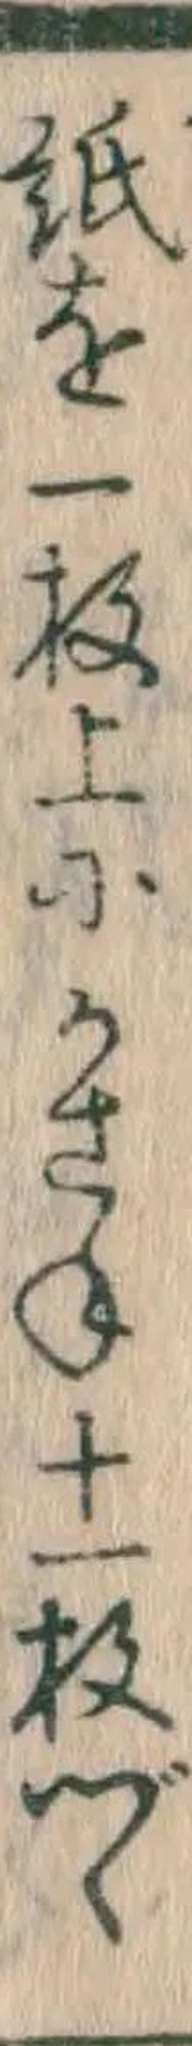紙を一枚上にかさね十一枚づゝ
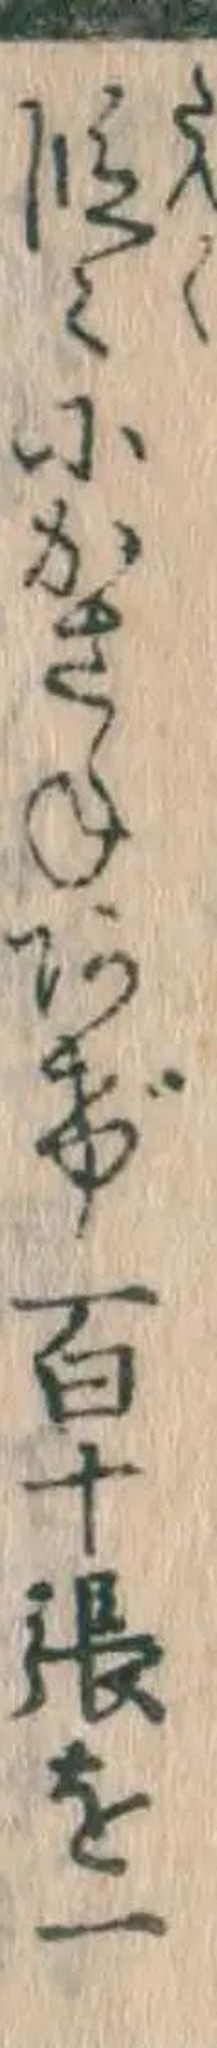段々にかさねあげ百十張を一
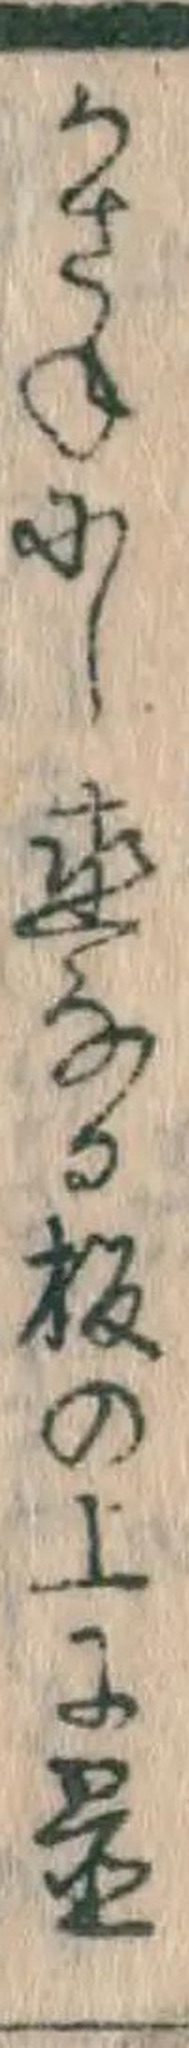かさねにし直なる板の上に置
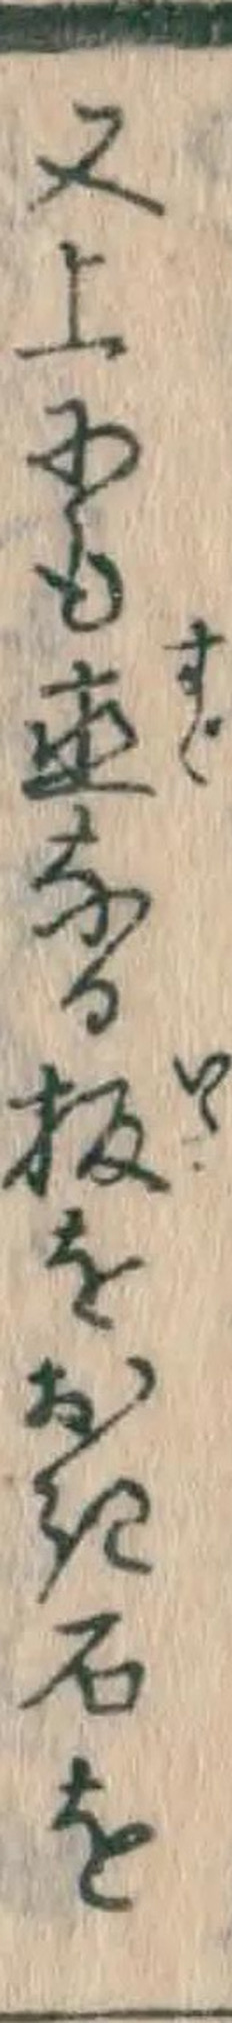又上にも直なる板をおき石を
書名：広益秘事大全 3巻. [2]
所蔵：国立国会図書館 National Diet Library, JAPAN
